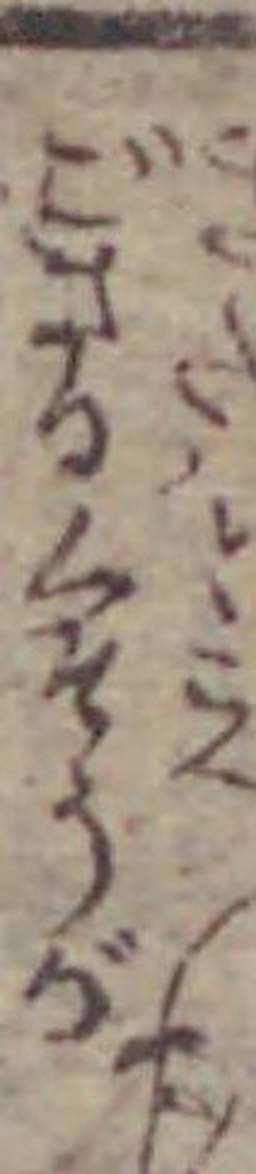ごさるくそうが
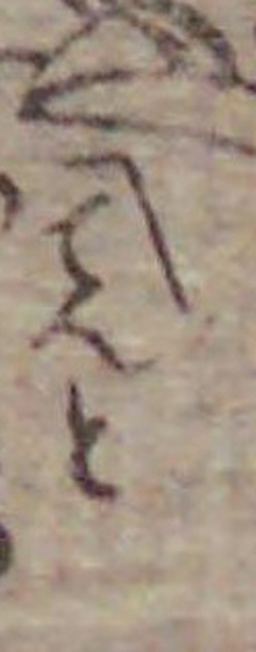〽てんと
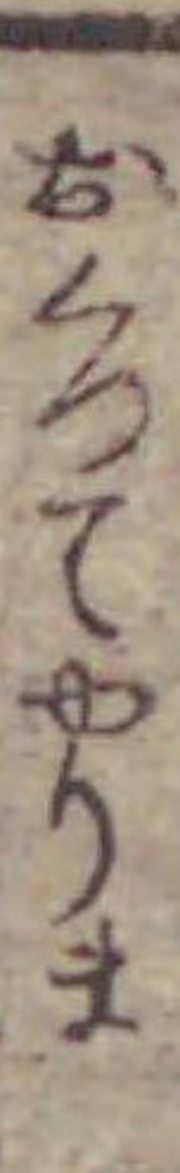おくつてやりま
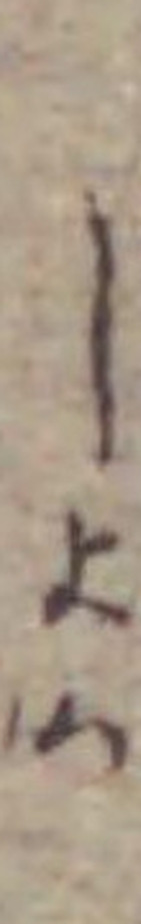しよか
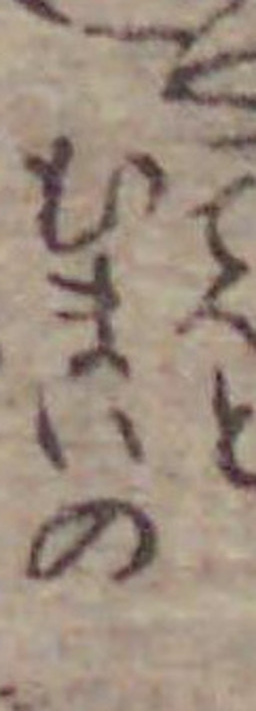むまいの
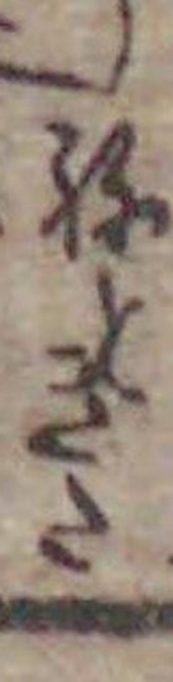ねときた
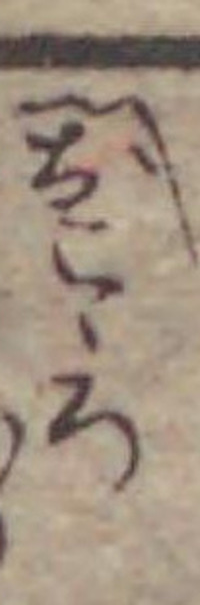〽おこゝろ
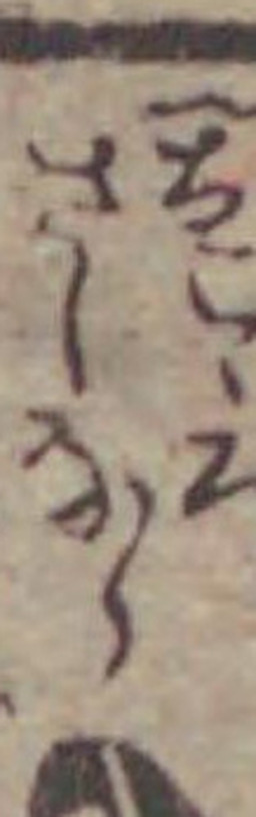さしなら
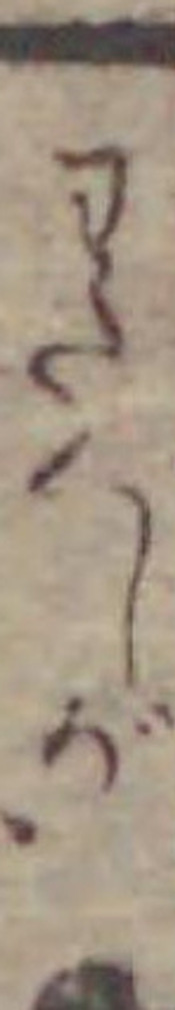わたくしが
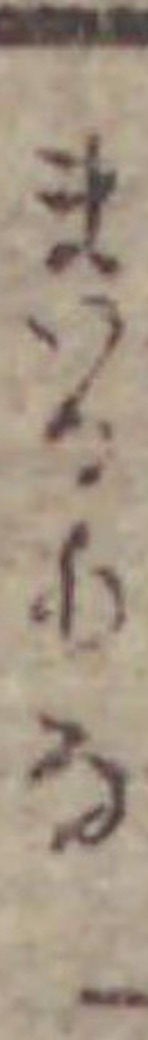まいるあな
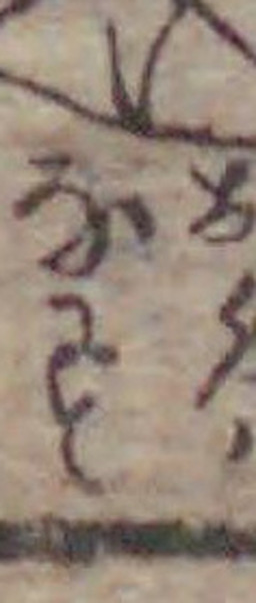なにと
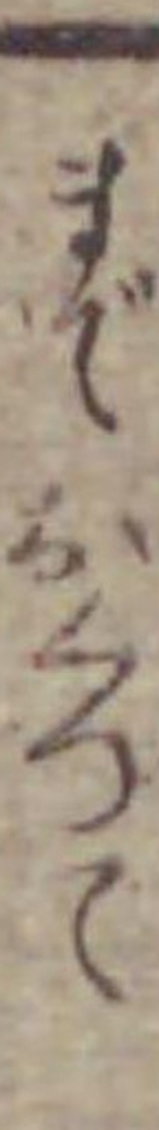までおくつて
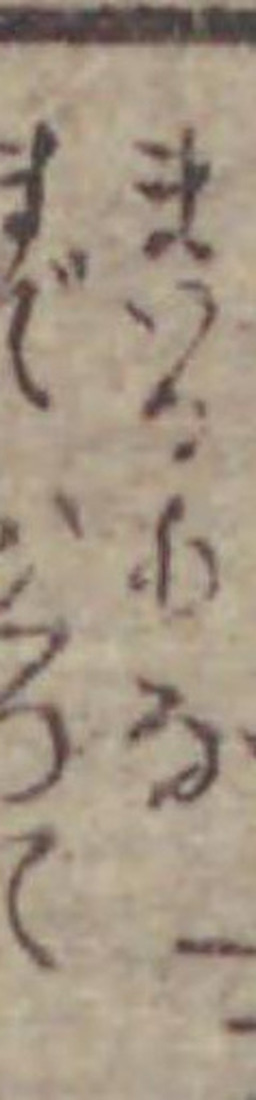までおくつて
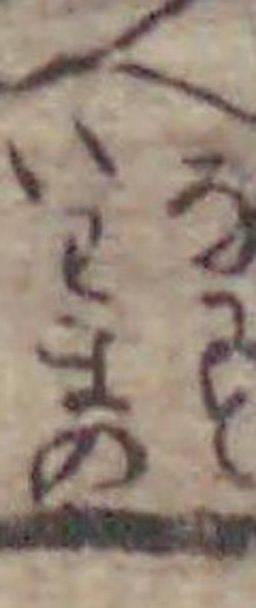いわまの
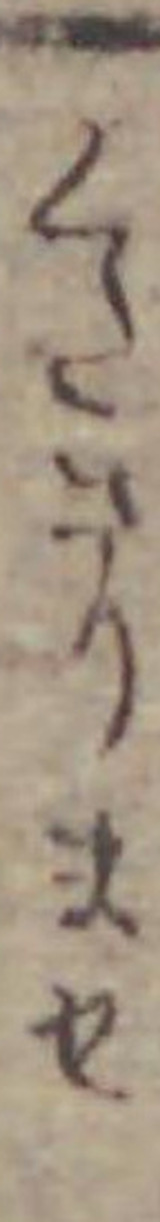くださりませ
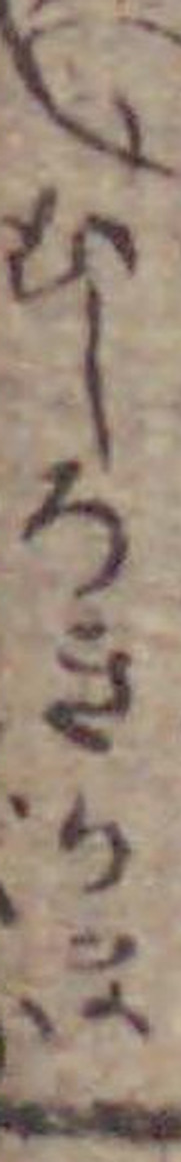むしろきかま
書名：妖怪仕内評判記 : 2巻
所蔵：国立国会図書館 National Diet Library, JAPAN
